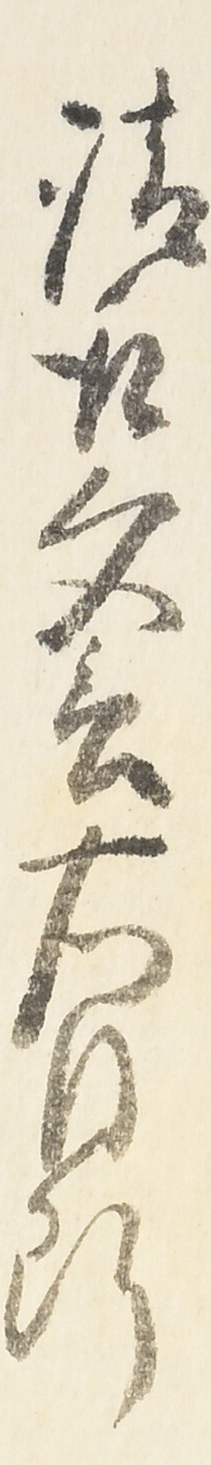請取文言右同断
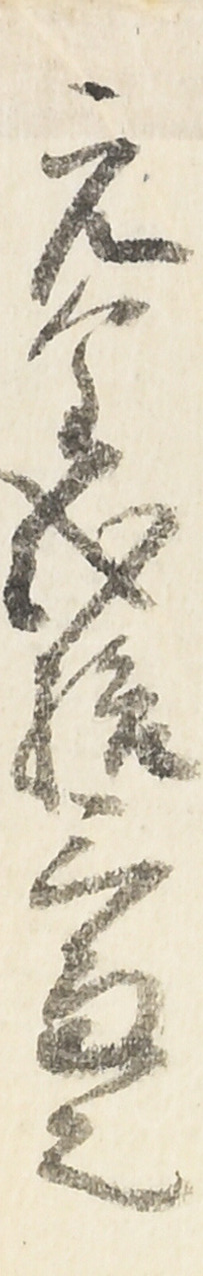元金弐拾三両也
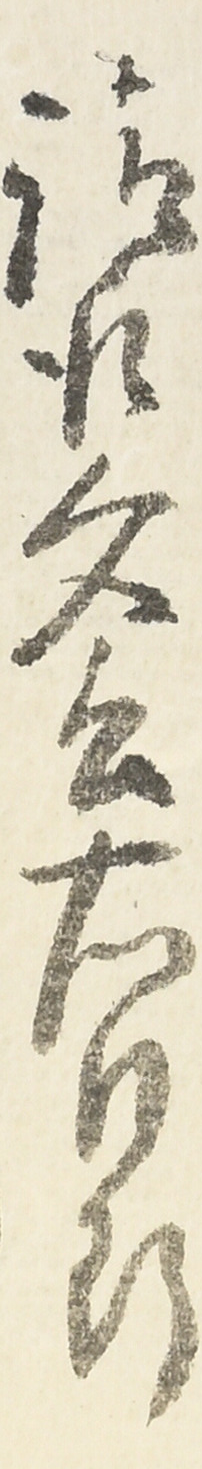請取文言右同断

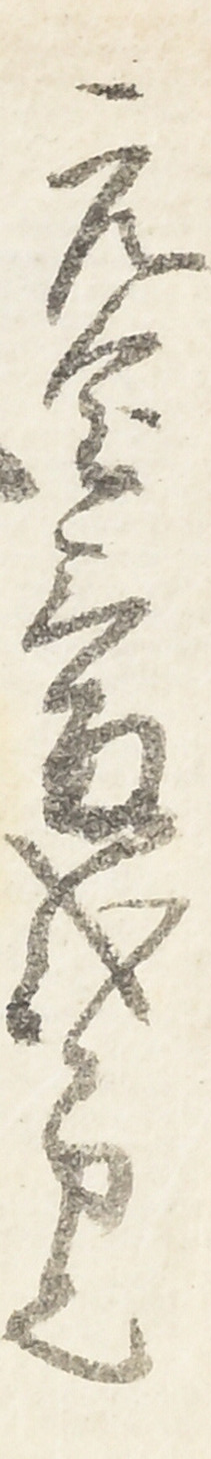元金三両弐分也
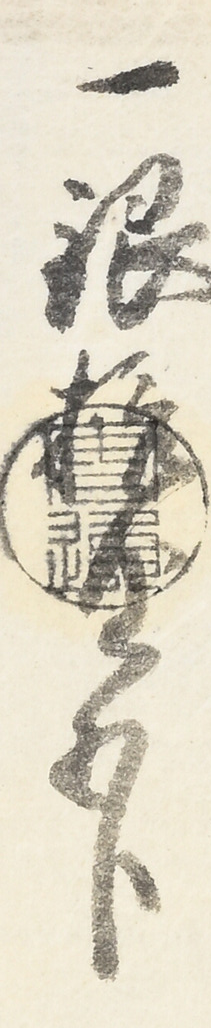一銀六匁
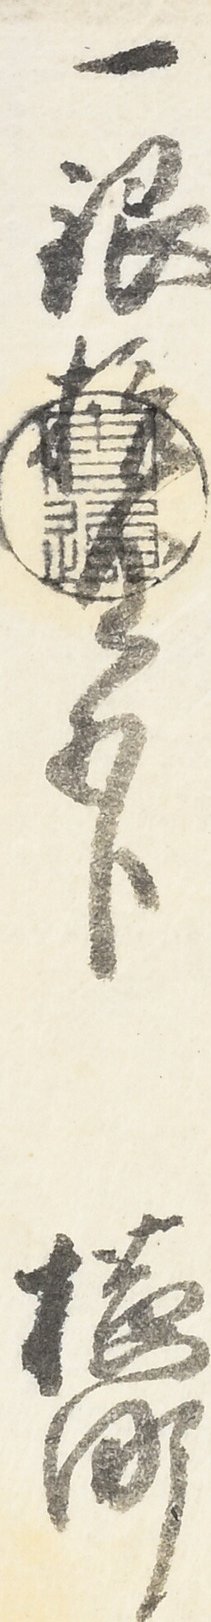一銀拾匁五分横町
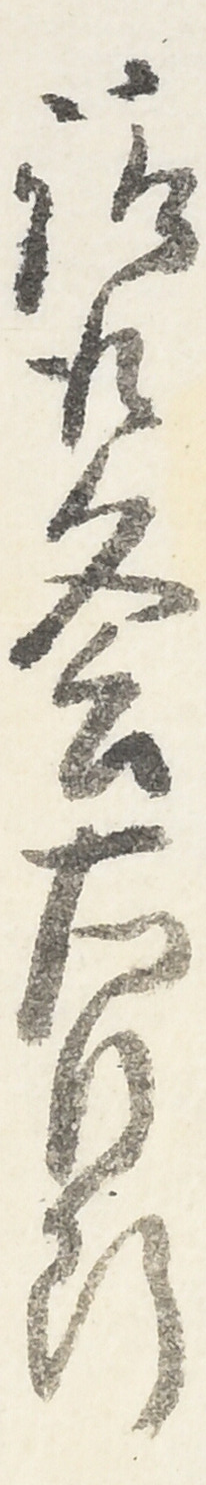請取文言右同断
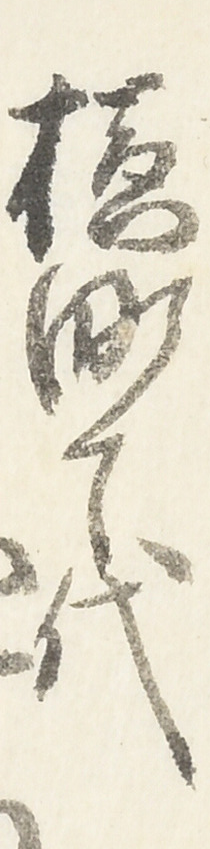横町丁代
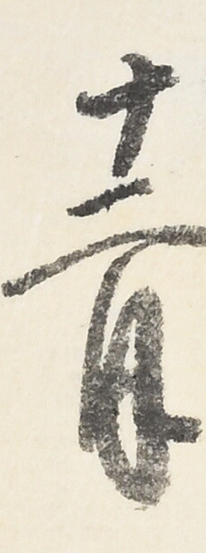十二月
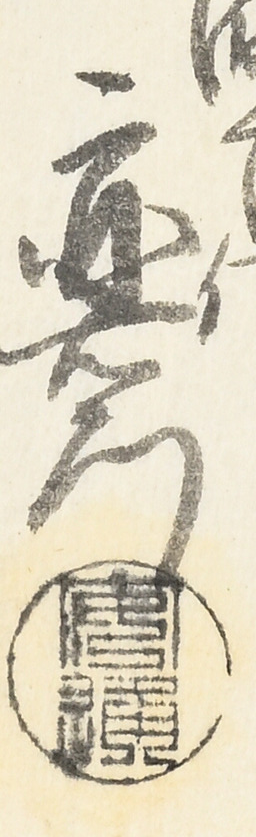午亦右衛門
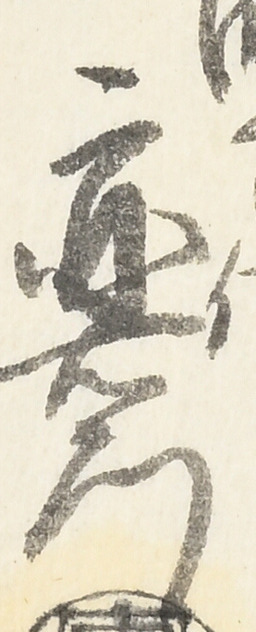午亦右衛門
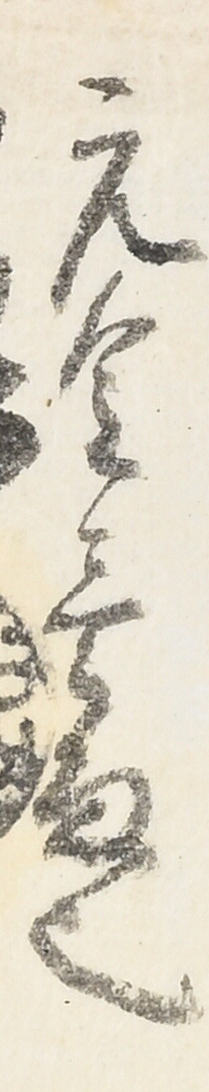元金壱両也
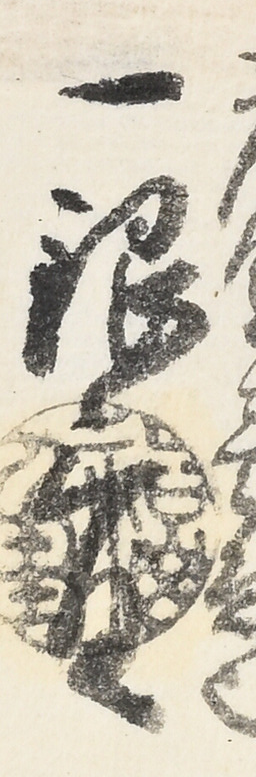一銀六匁
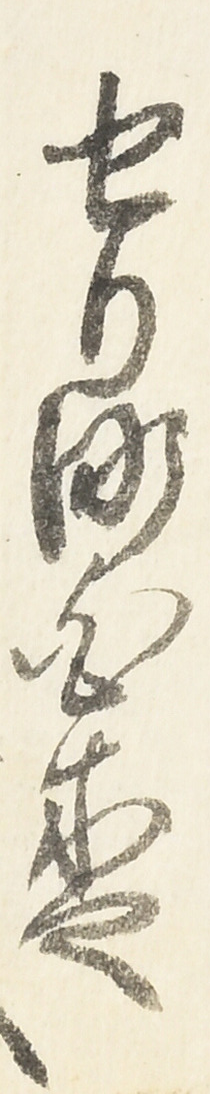せり町丁代
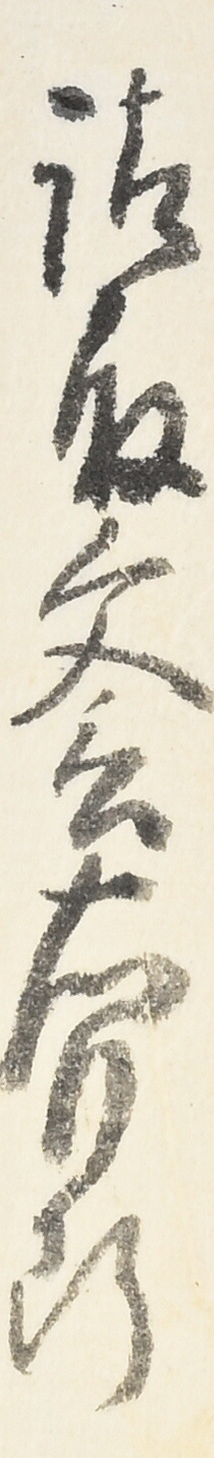請取文言右同断
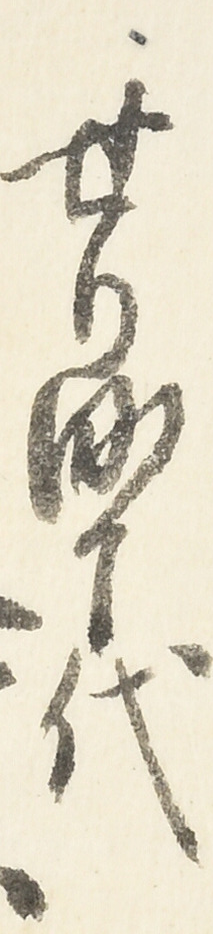せり町丁代
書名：御才覚金御利足割渡扣帳
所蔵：伊那市立高遠町図書館・合同会社AMANE
